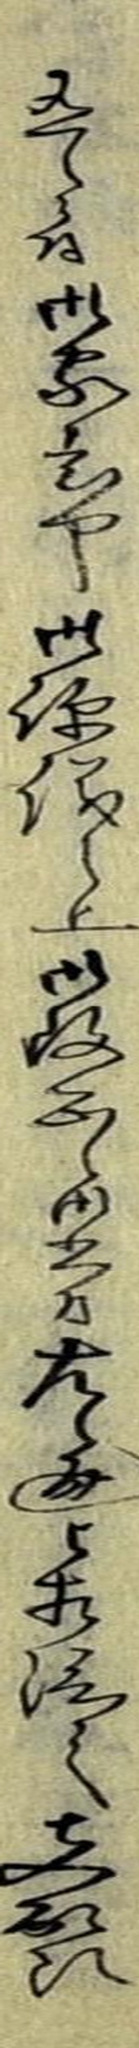有之候に付御家老中御評議之上御改正之御書付左之通被相渡之支配頭
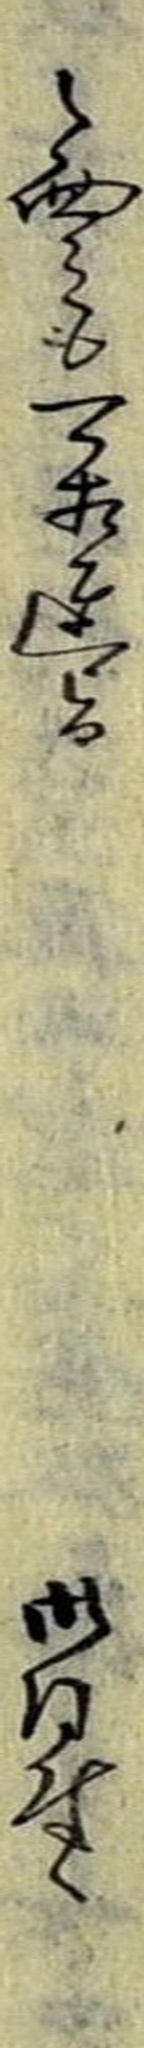之面々へも可相達旨御目付へ
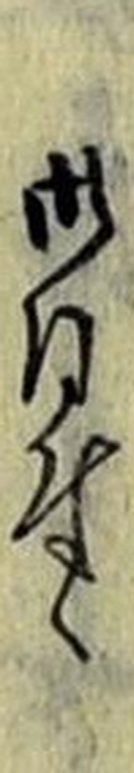御目付へ
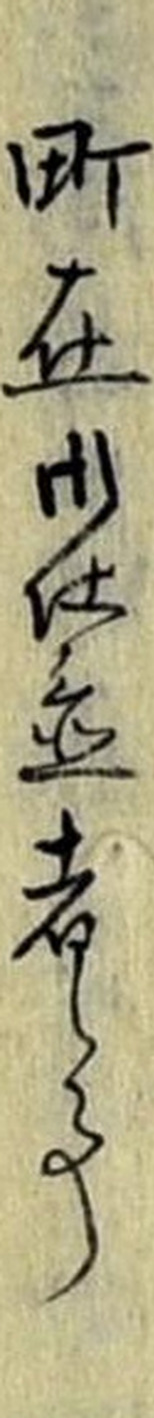町在御仕置者之事
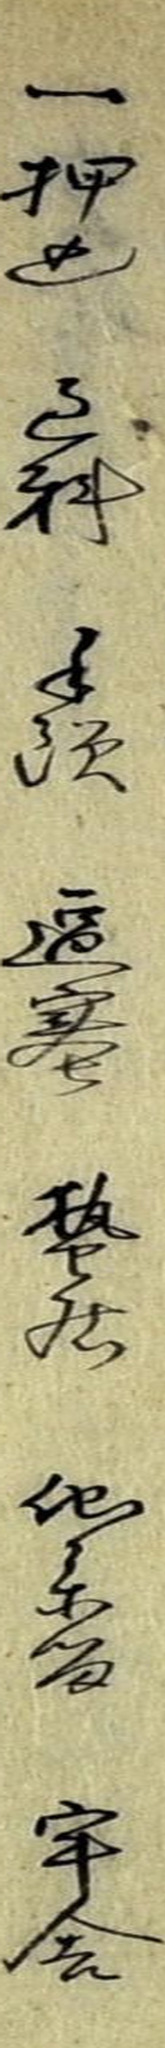一押込過料手鎖逼塞蟄居他所留牢舎
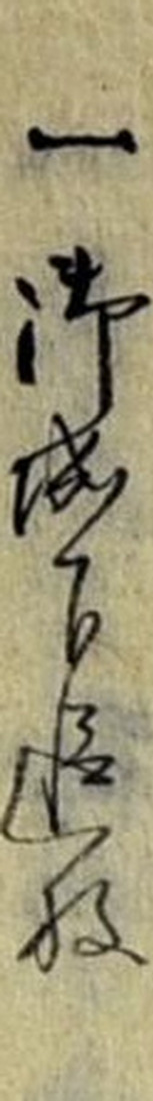一御城下追放
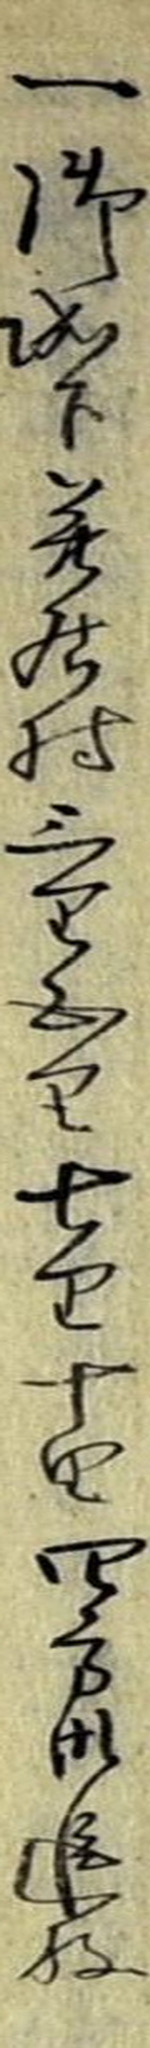一御城下并居村三里五里七里十里四方御追放
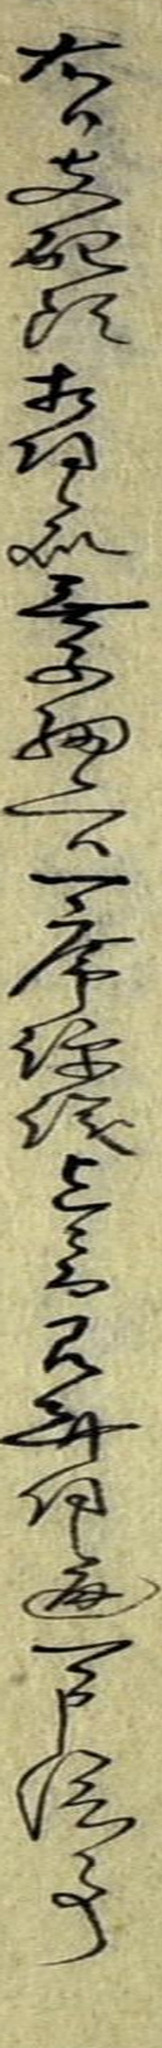右は支配頭相伺候処無子細候へは一席評議迄に而即刻伺之通可申渡事
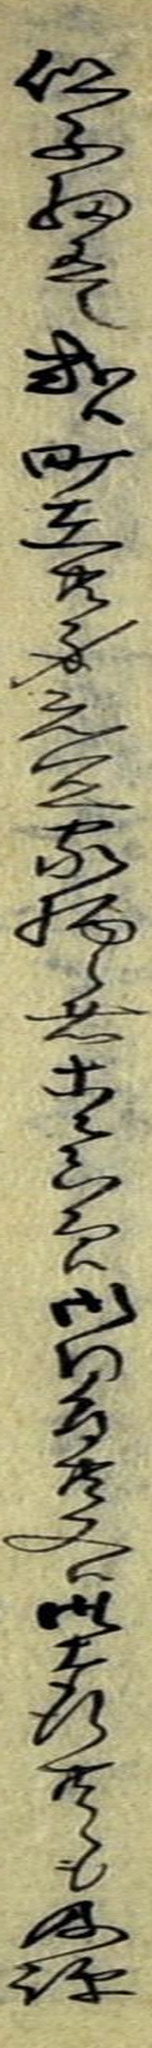但子細有之或は町在共身元宜家柄之者等に至而は御目付共又は御奉行共へも及評
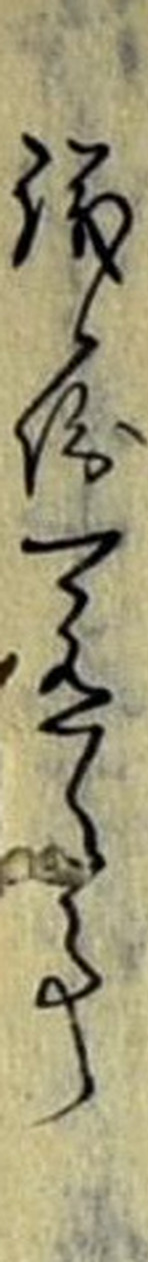議之儀可有之事

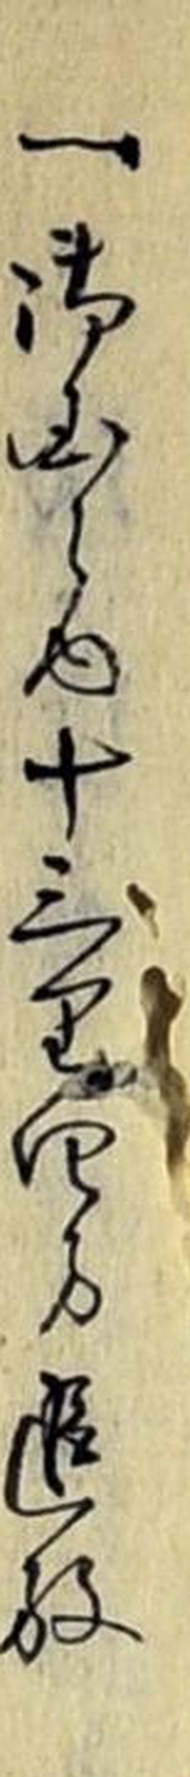一御国之内十三里四方追放
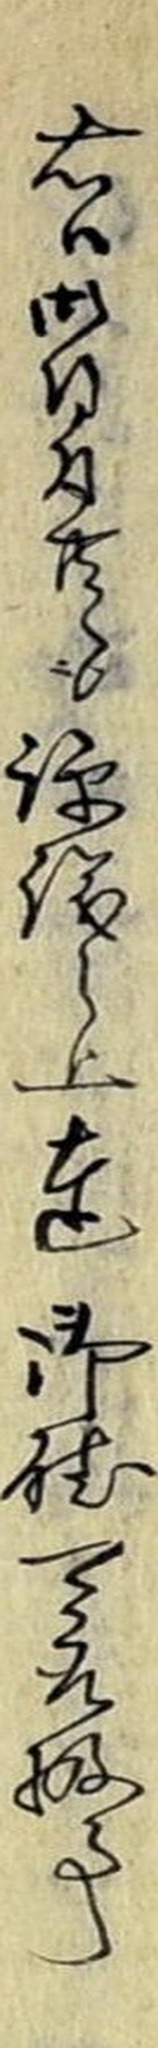右は御目付共へも評議之上達御聴可被取扱事
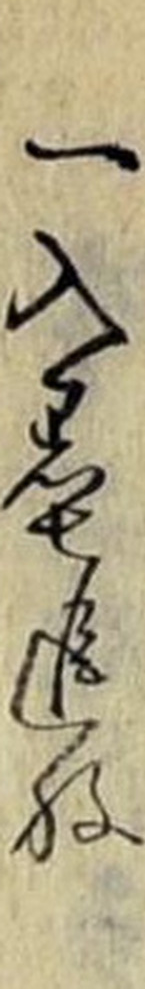一入墨追放
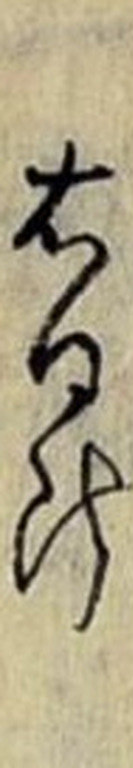右同断
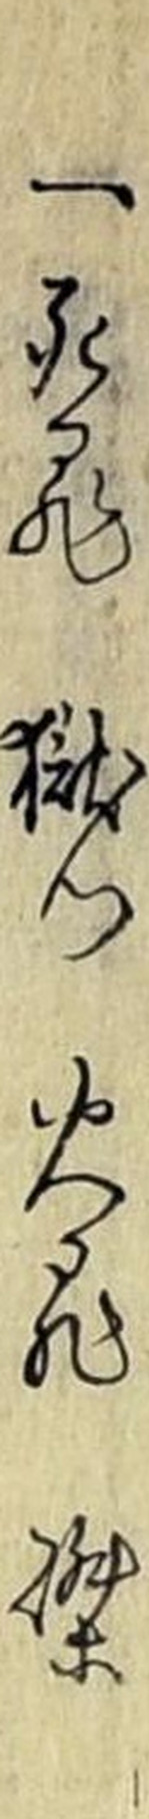一死罪獄門火罪磔
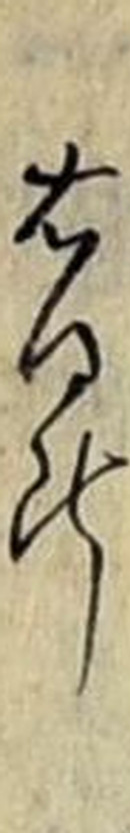右同断
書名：命令之部 四
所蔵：福井県文書館 Fukui Prefectural Archives
